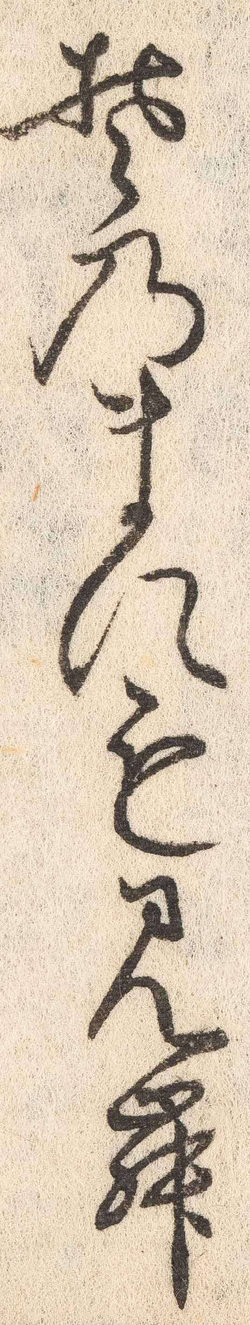そのまにもみむ

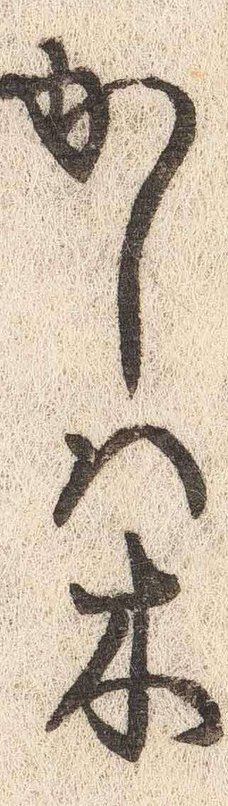かしは木
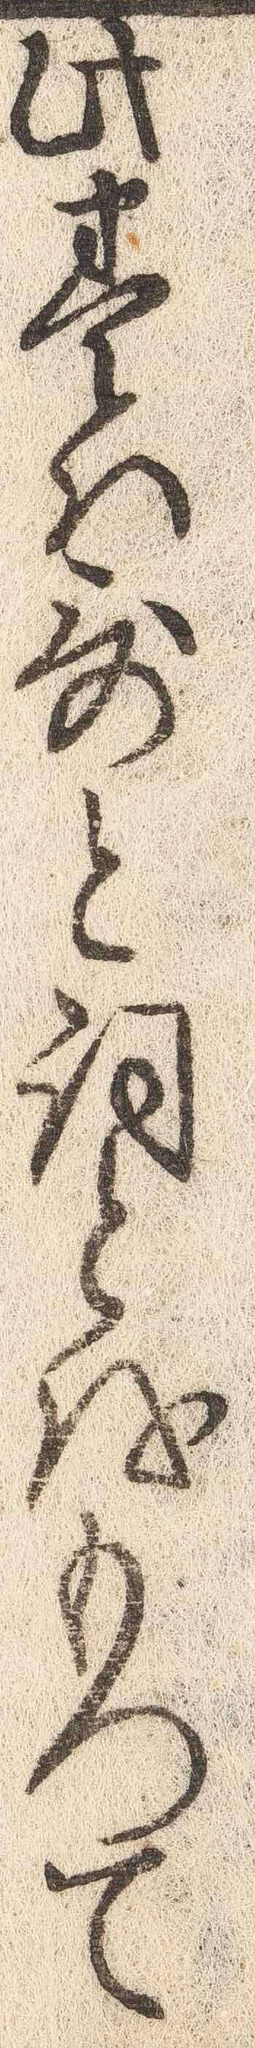此巻は哥と詞とをもつて
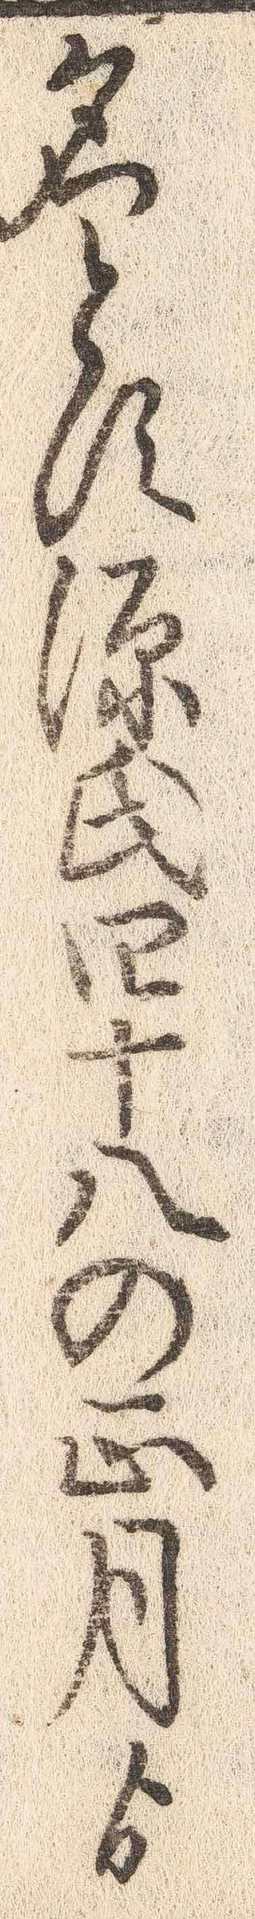名とす源氏四十八の正月より
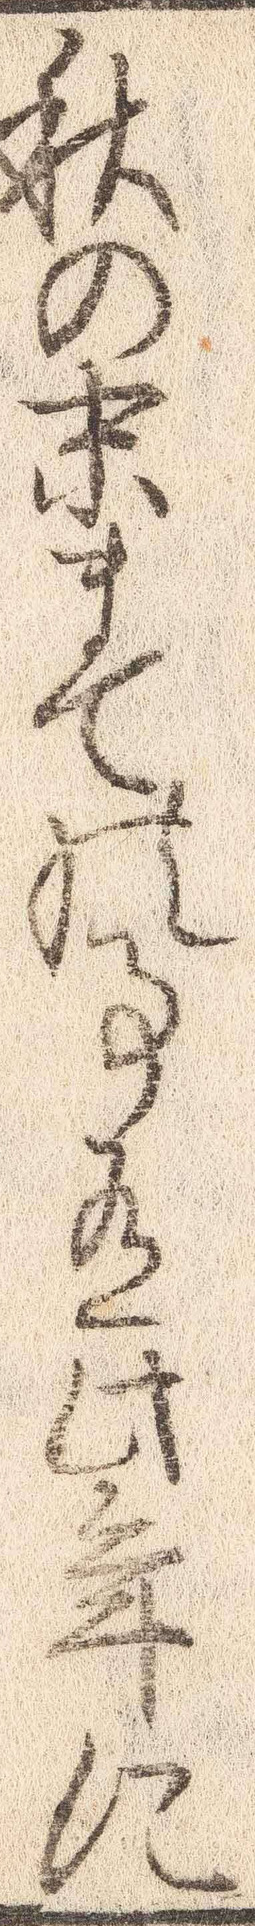秋の末までの事有此年に
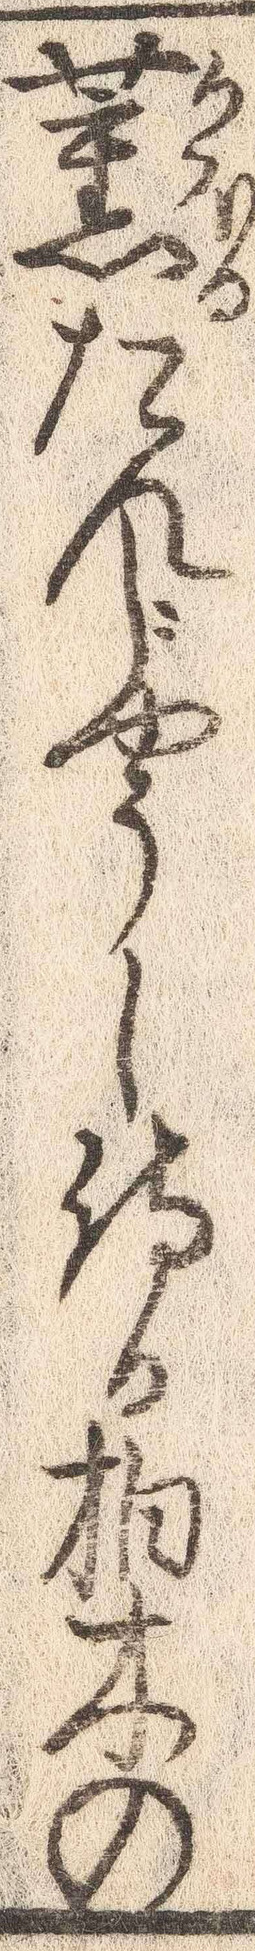薫たんじやうし侍る柏木の
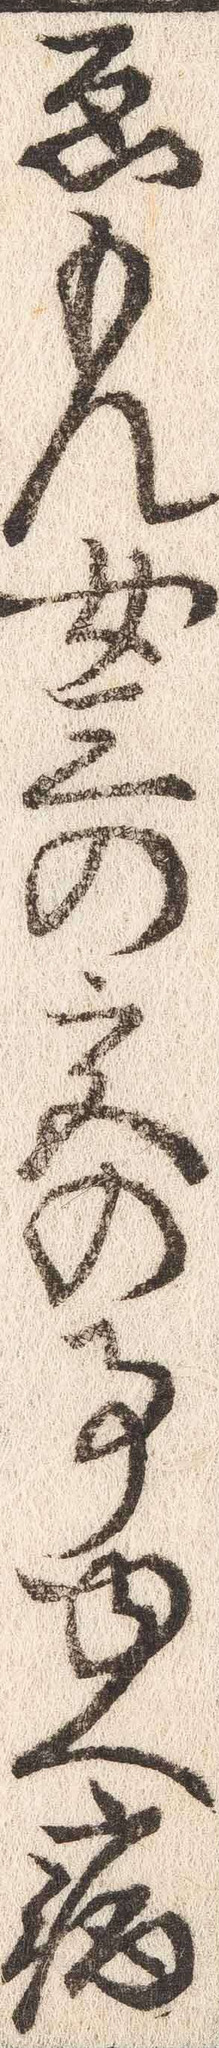ゑもん女三の宮の事ゆへ病
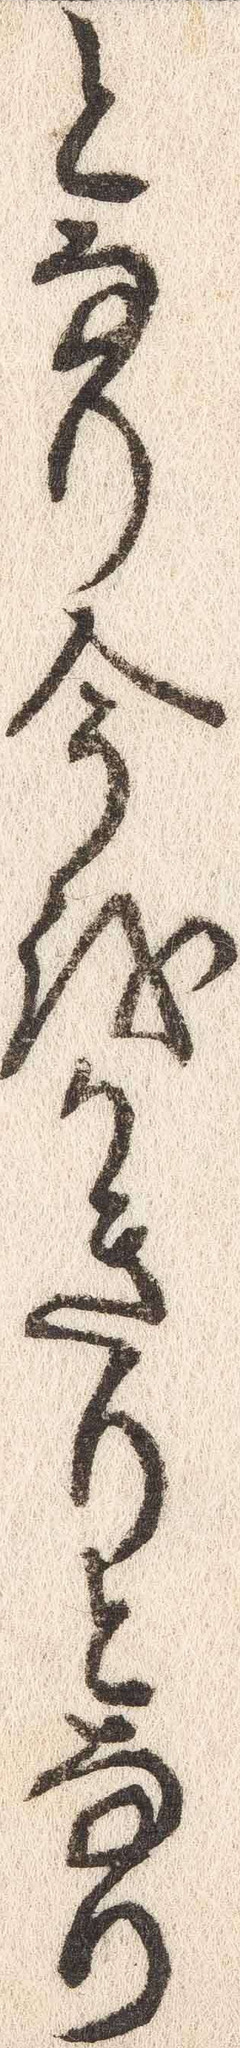となり今をかきりとなり
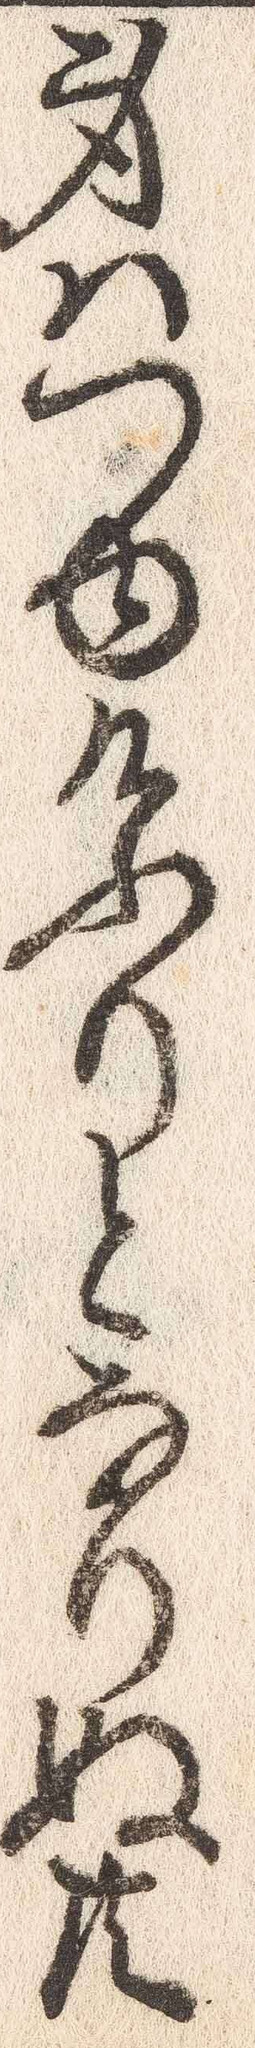身はつゆけふりとなりぬ共
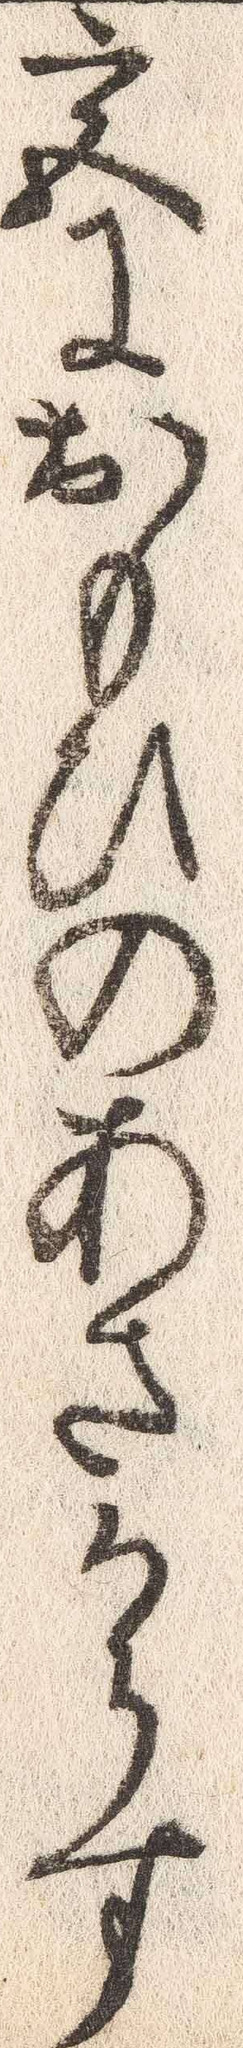宮におもひのあさからす
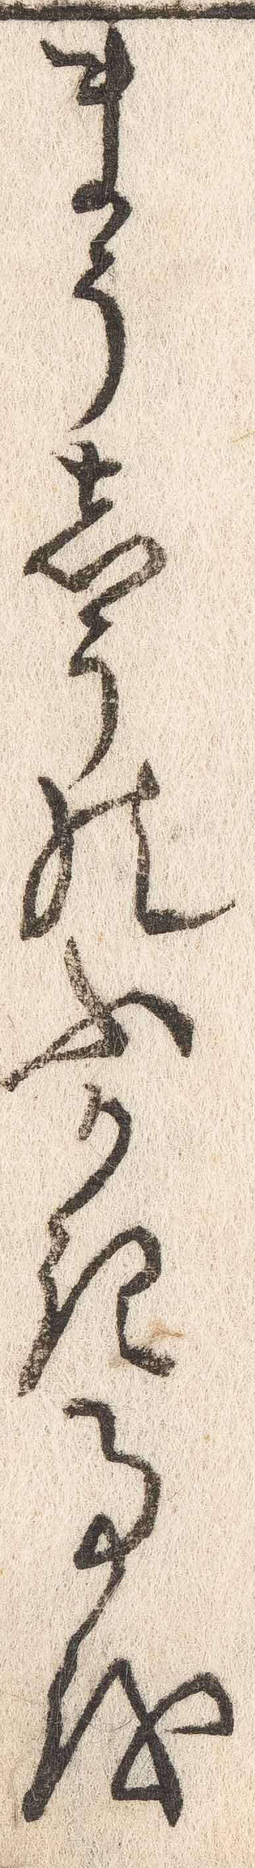まうしうのふかき事を

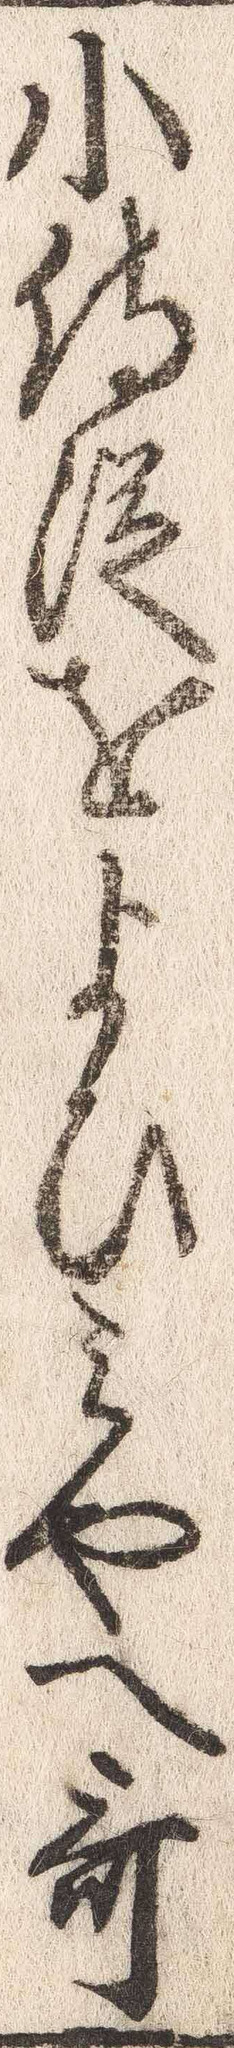小侍従をよひみやへ歌
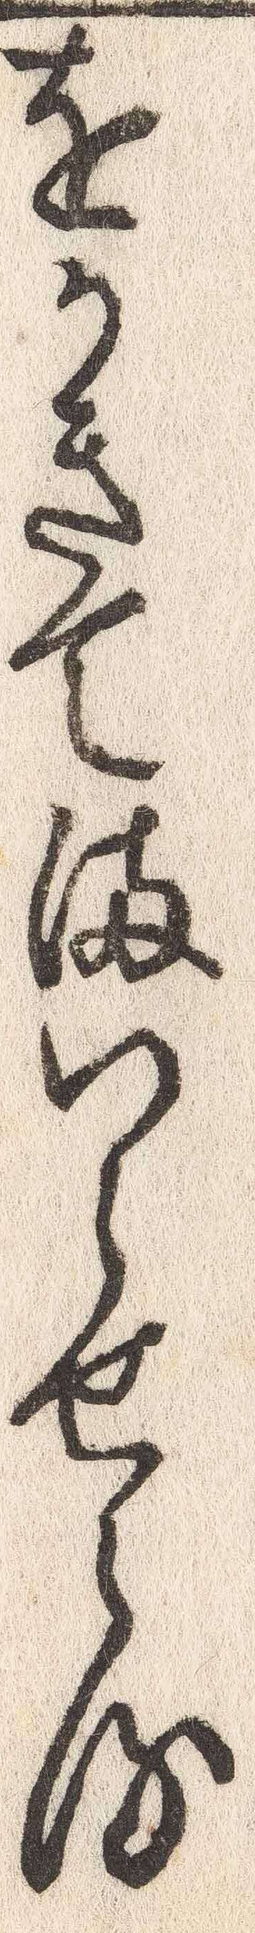をかきてまいらせらる
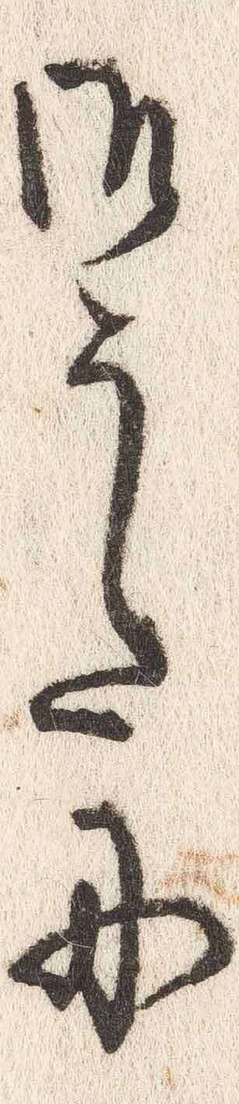御うたに
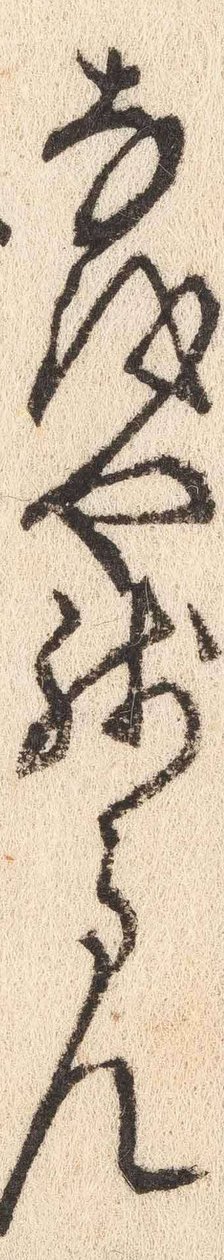なをや残らん
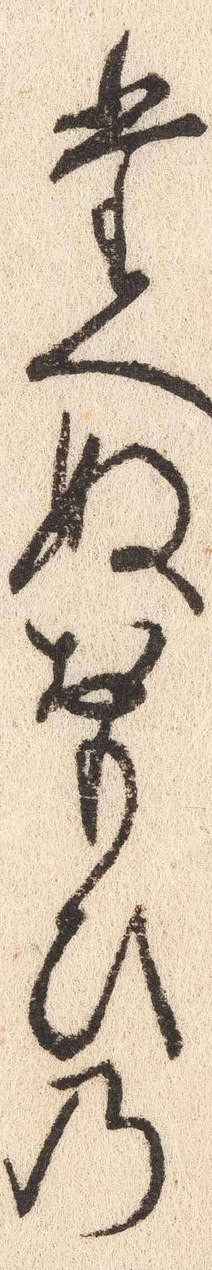たへぬおもひの
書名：源氏物語
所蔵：東京学芸大学附属図書館 国文学研究資料館
